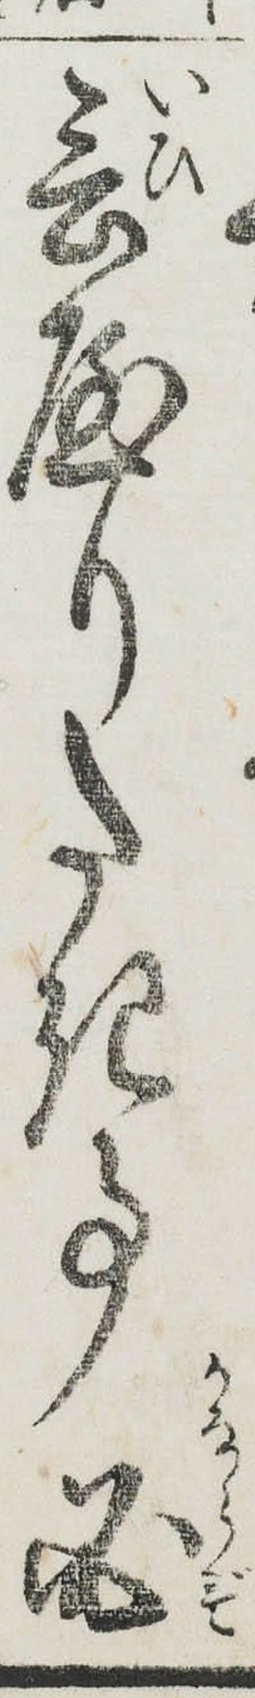言やりたき事必
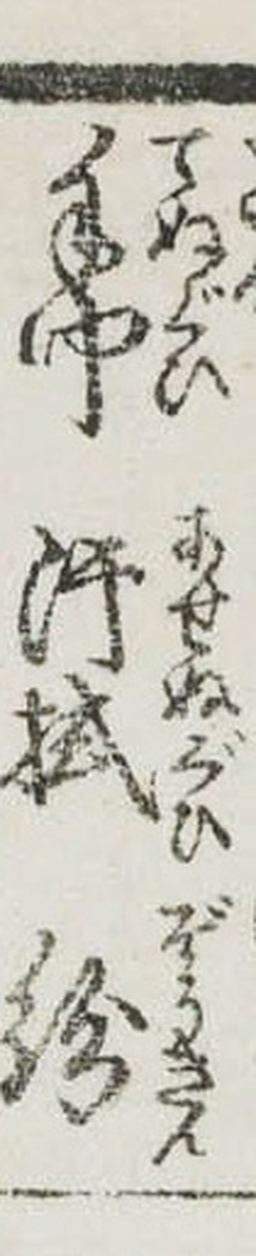手巾汗拭紛
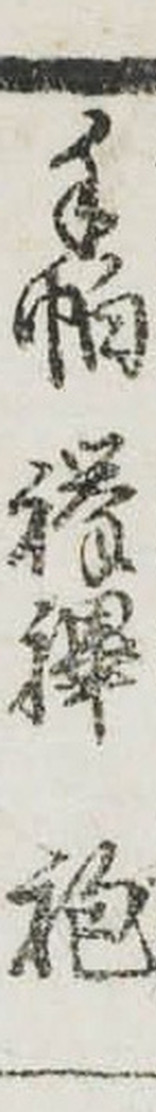手帕襷襅袍
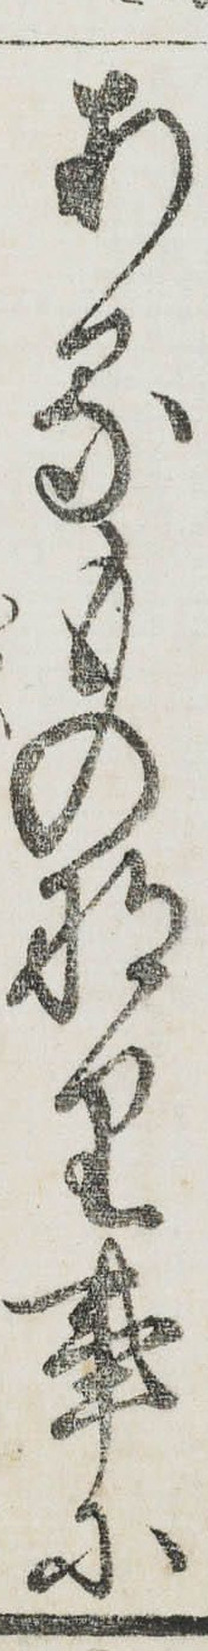あるものなり事に
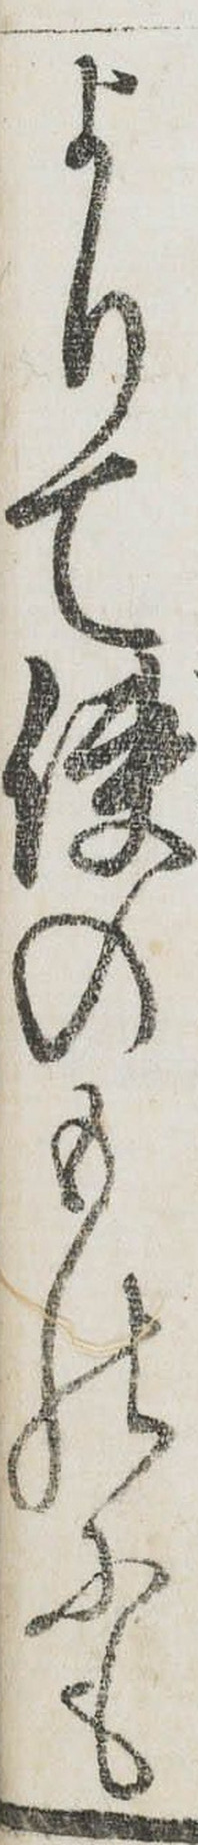よりて使のものにも
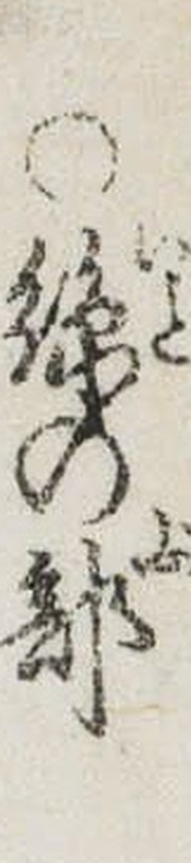○絲の部
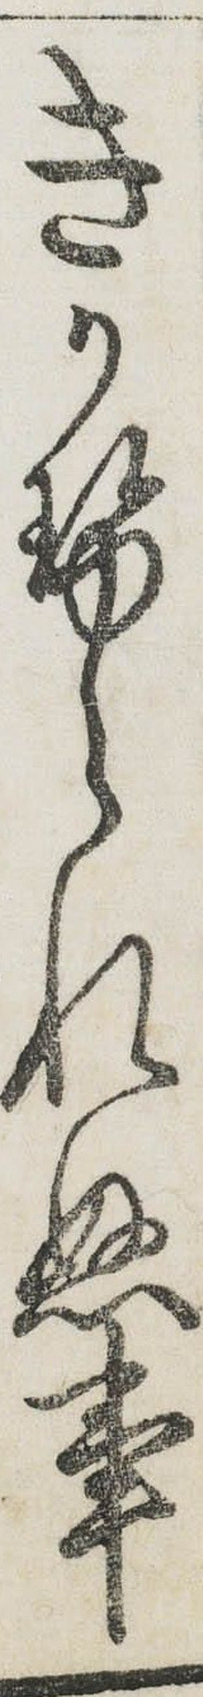きかせられぬ事
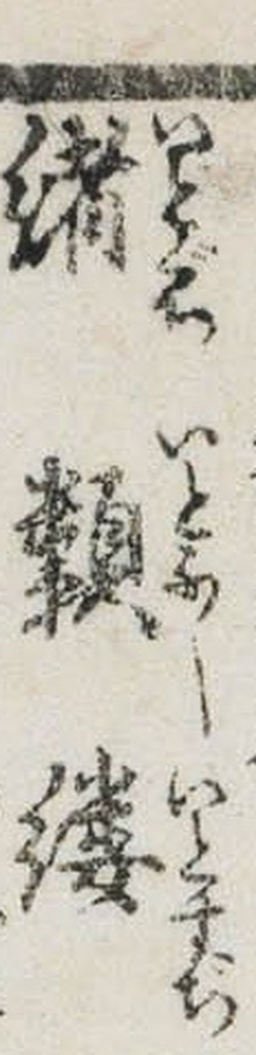緒類縷
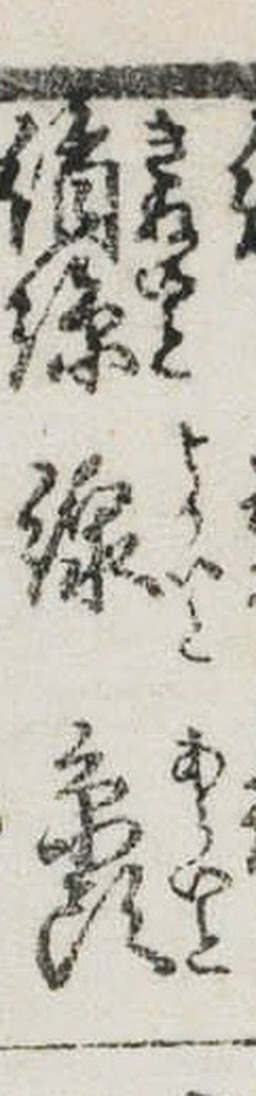絹絲線糸頭
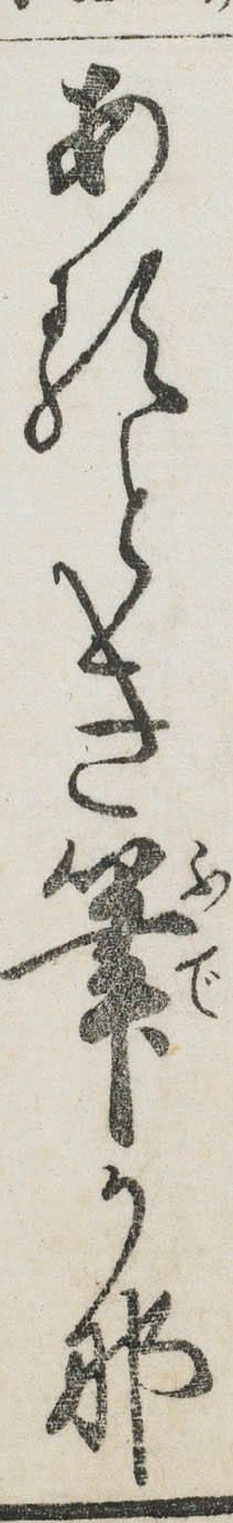あるとき筆かな
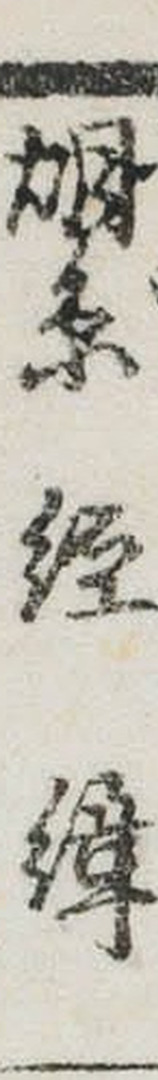胡糸経緯
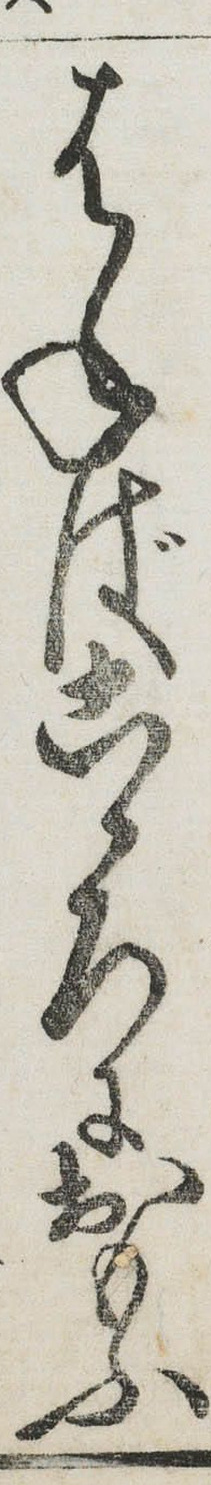はねばこゝろにおもふ
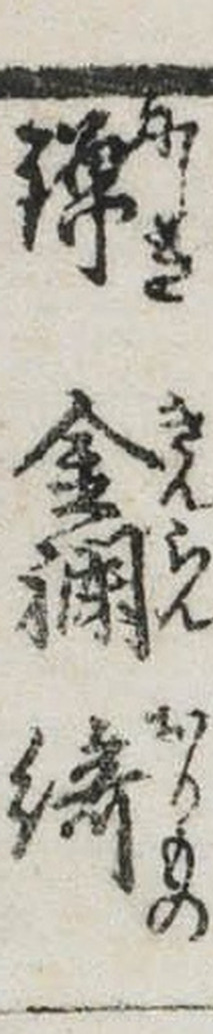錦金襴綺
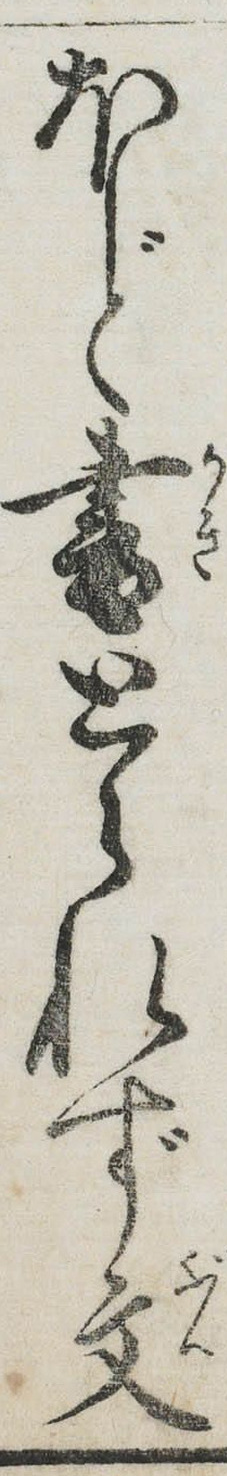ほど書とられず文
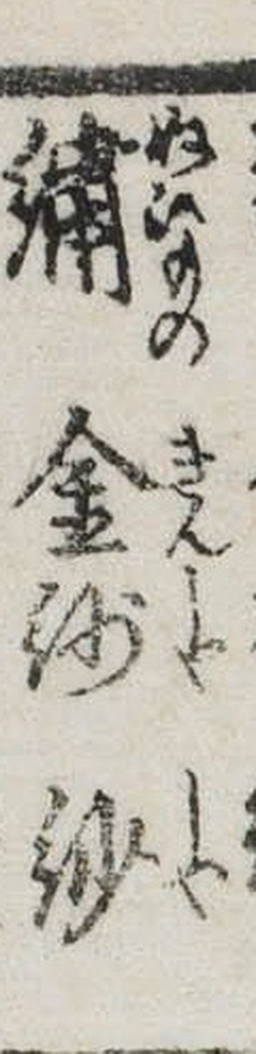繍金紗紗
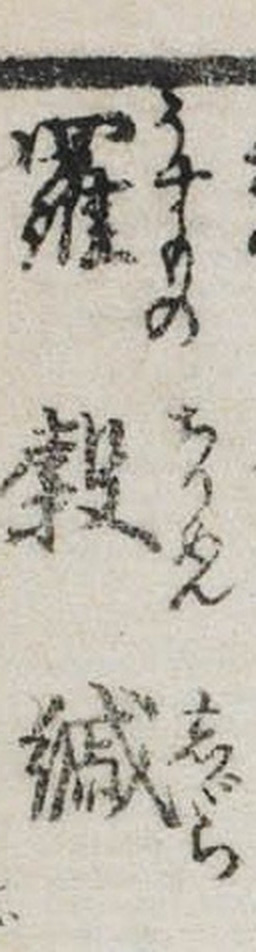羅穀縬
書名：頭書萬用婦人手紙之文言
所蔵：東京学芸大学教育コンテンツアーカイブ
